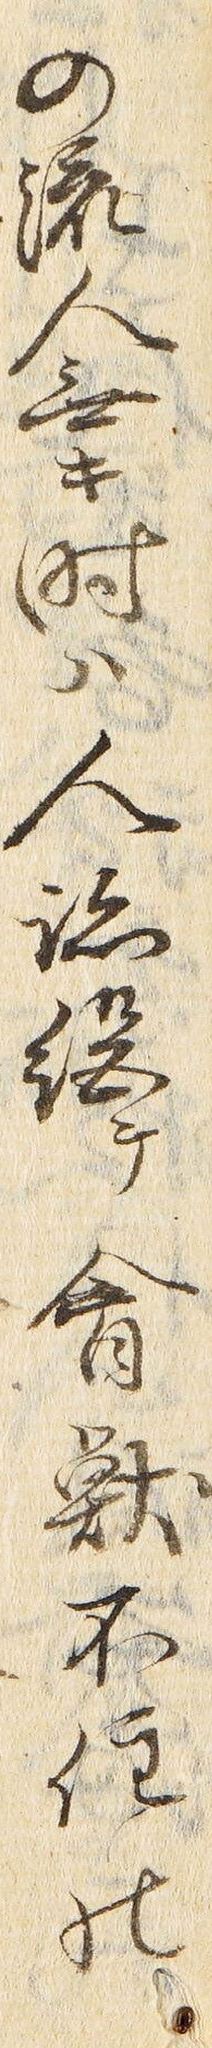の流人無キ時は人跡絶禽獣不住の
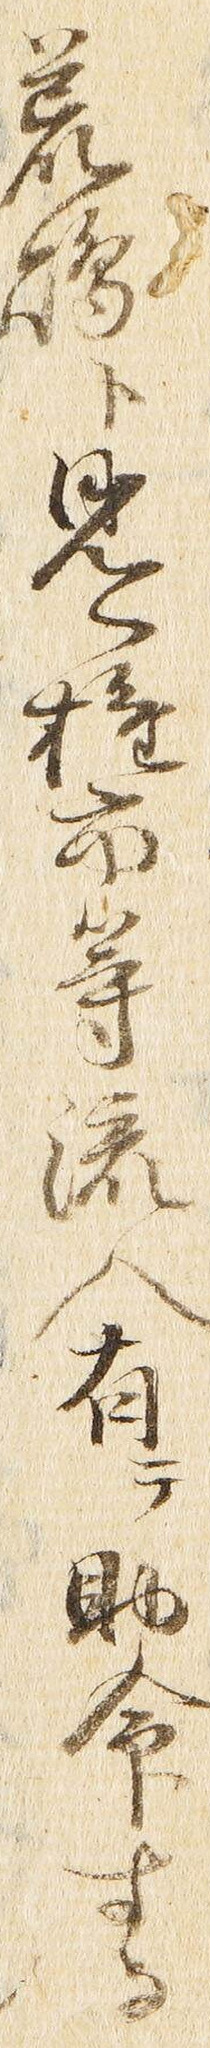荒島ㇳ見へ権市等流人有助命する
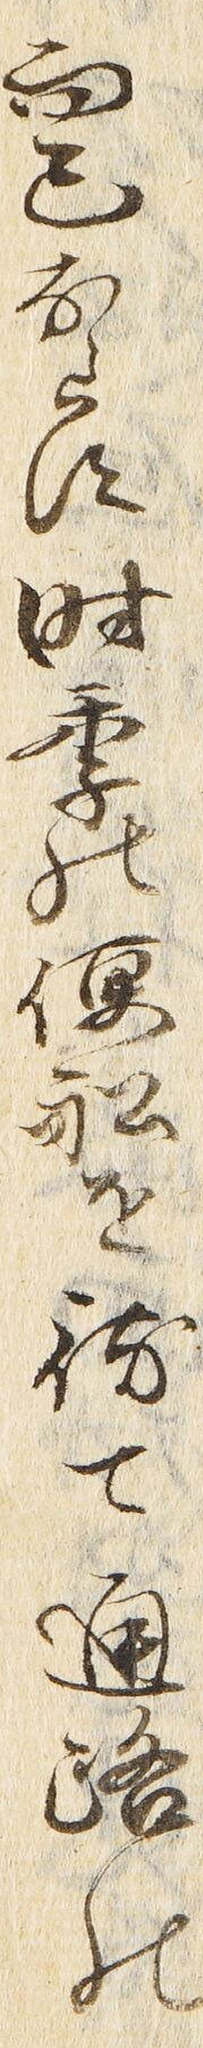而巳ならす時季の便船を待て通路の
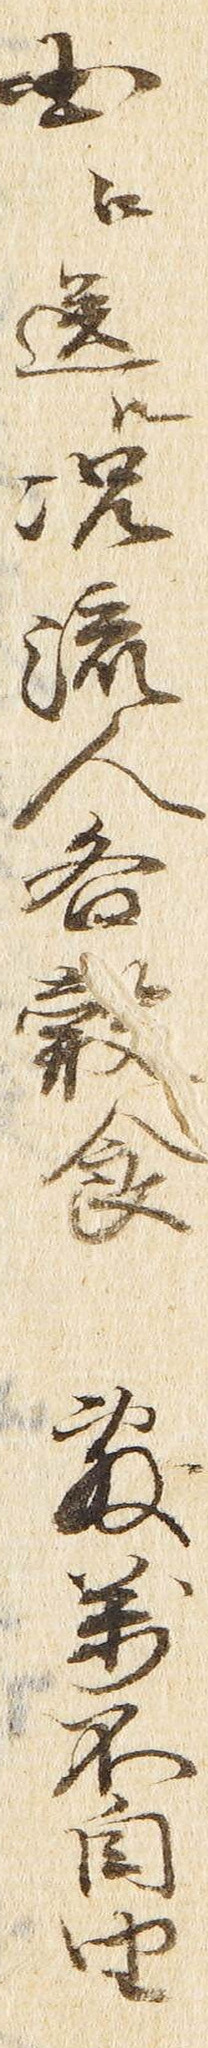国え送ㇽ况流人各穀食敷万不自由
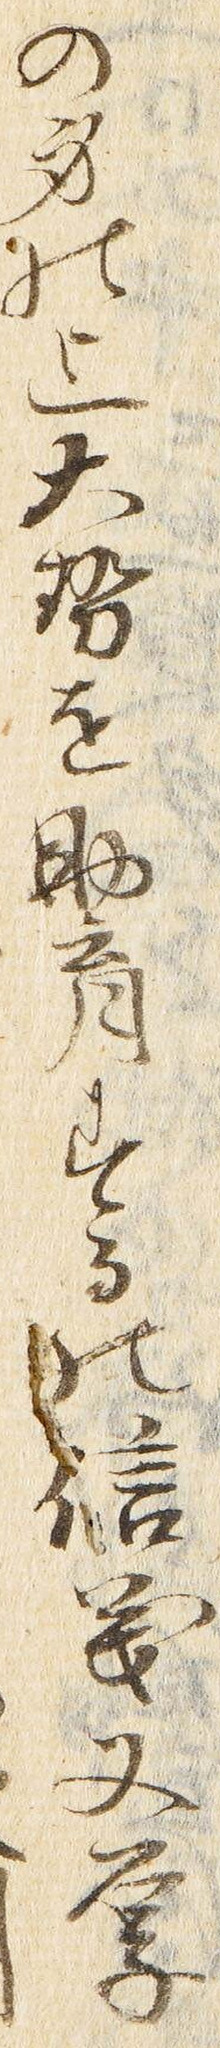の身の上大勢を助育するの信義又厚
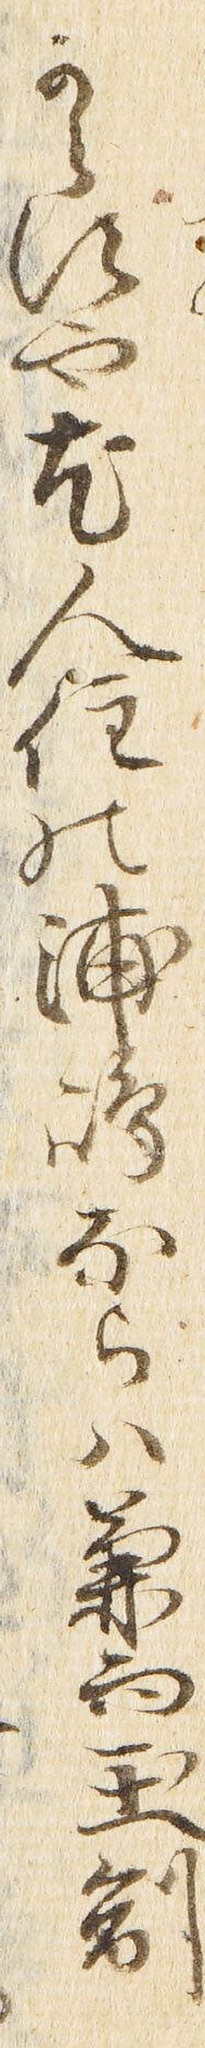からすや尤人住の浦島ならは兼而玉制
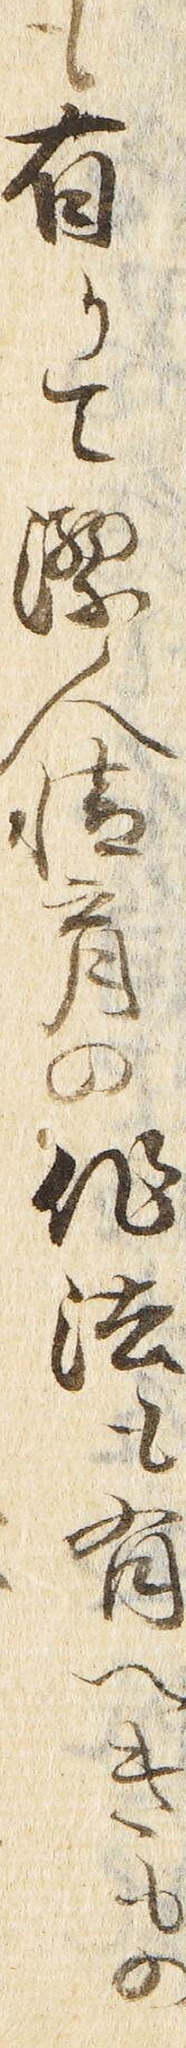も有りて漂人情育の作法も有へきもの
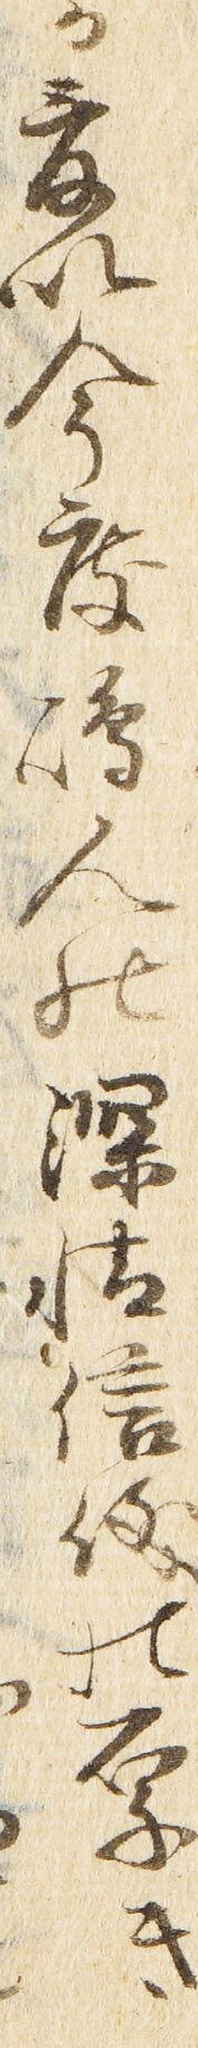か爰以今度島人の深情信義の厚き
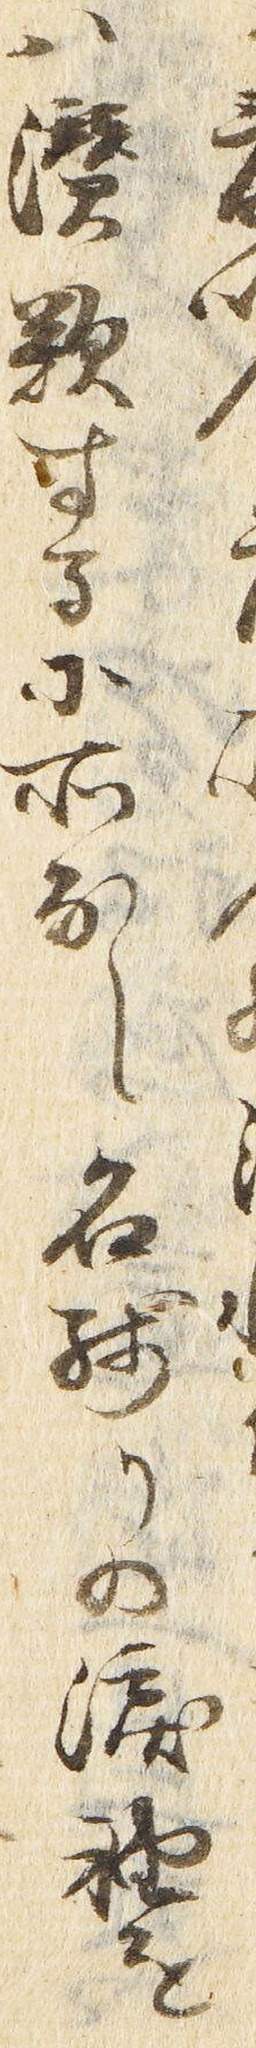は讃歎するに所なし名残りの涙袖を
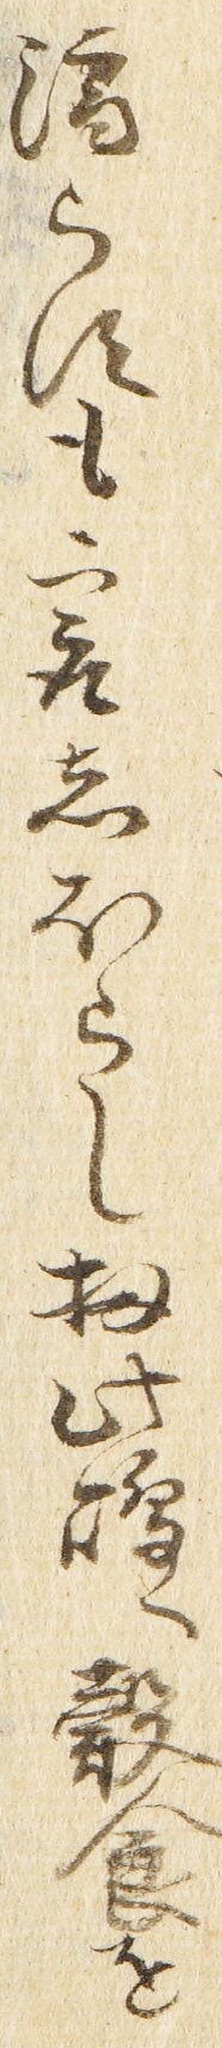濡らすも最しほらし扨此島へ穀食を
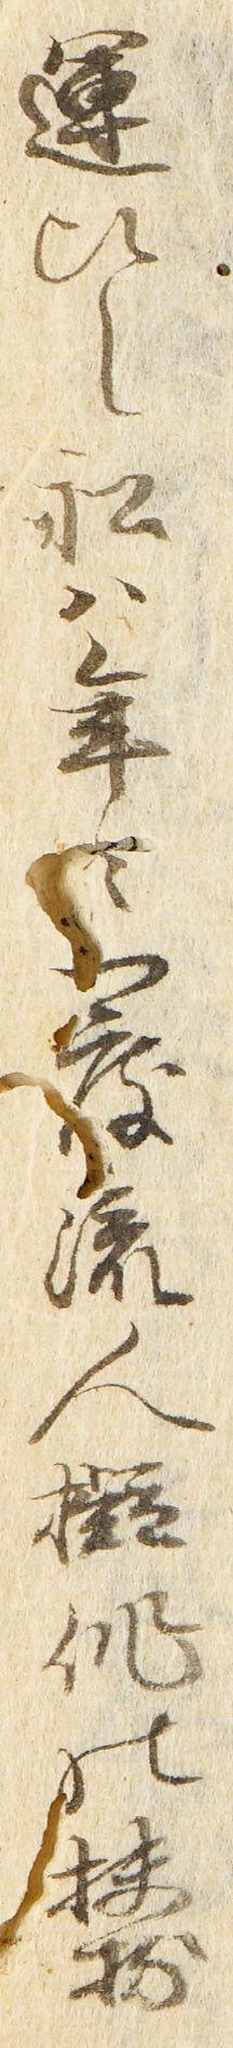運ひし船は年に一度流人擬作の扶持

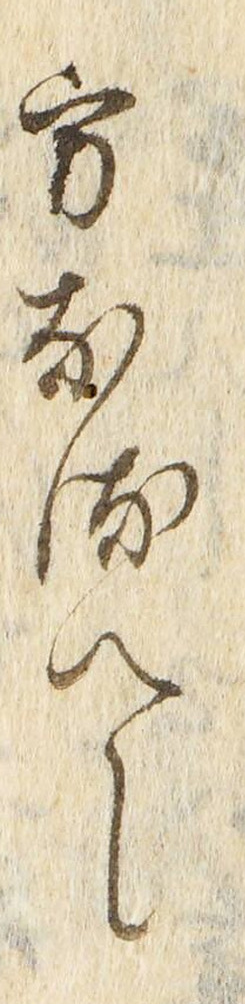方なるへし
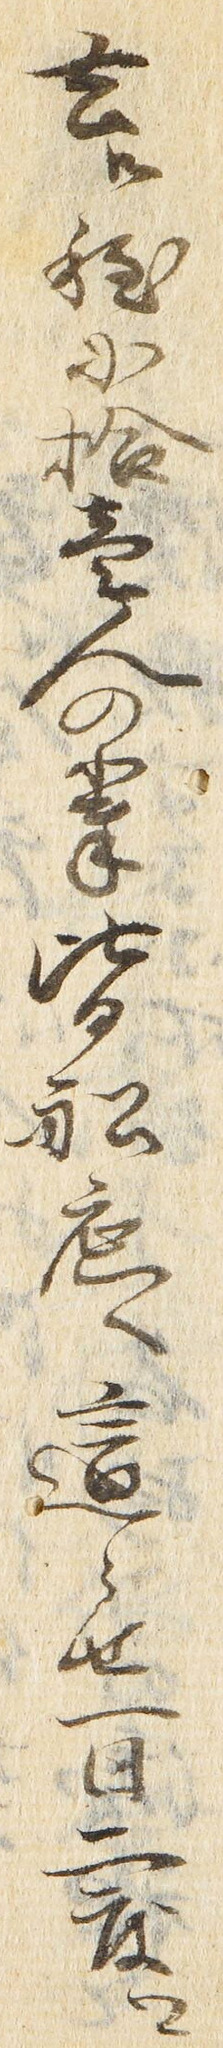去る程に拾壱人の輩皆船底へ這らせ一日に度つゝ
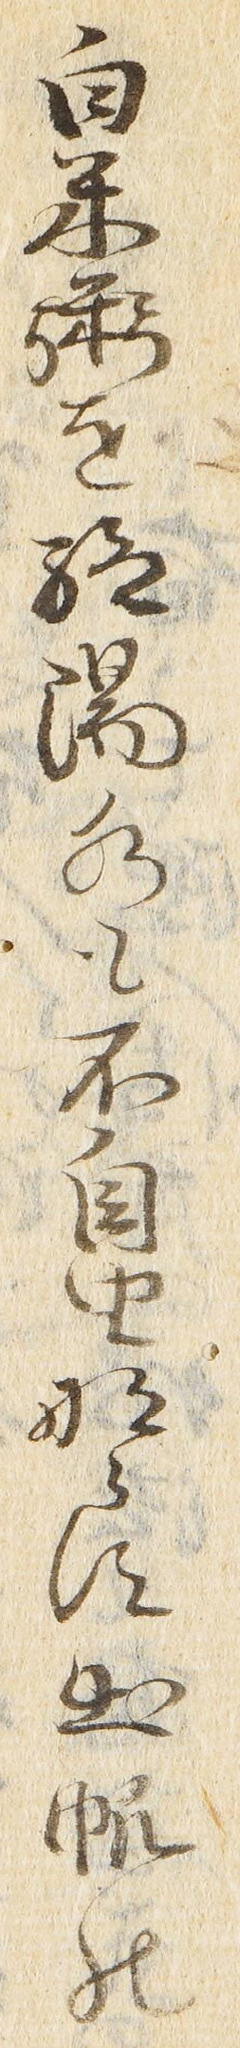白米粥を給湯水も不自由ならす出帆の
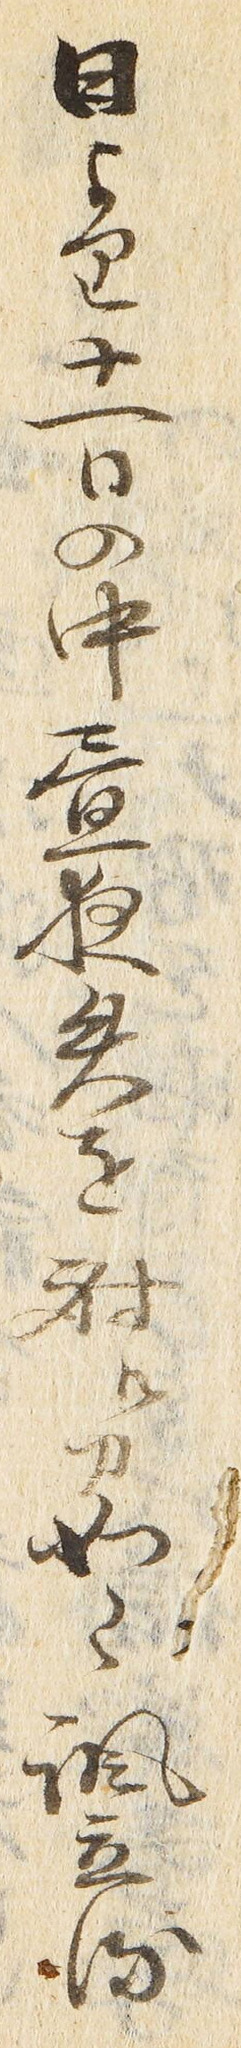日より十一日の中昼夜矢を射るか如く諷立る
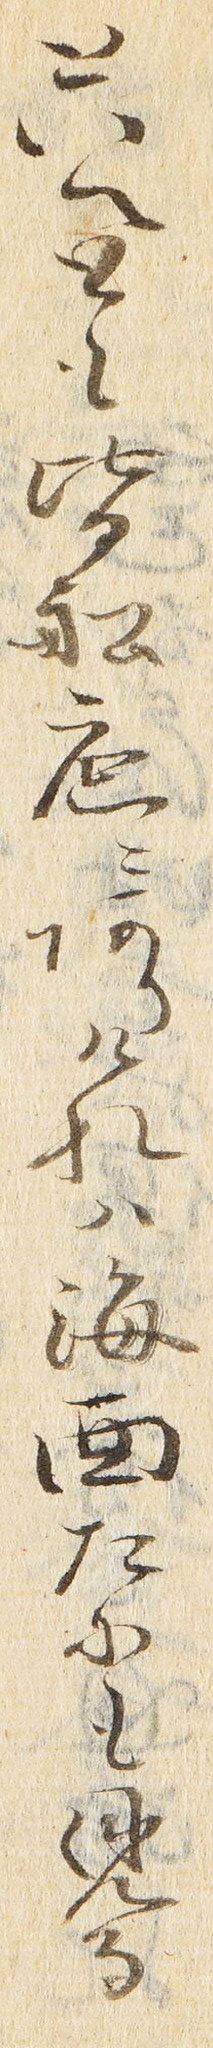といへとも皆船底にありけれは海面たにも見る
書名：唐物語
